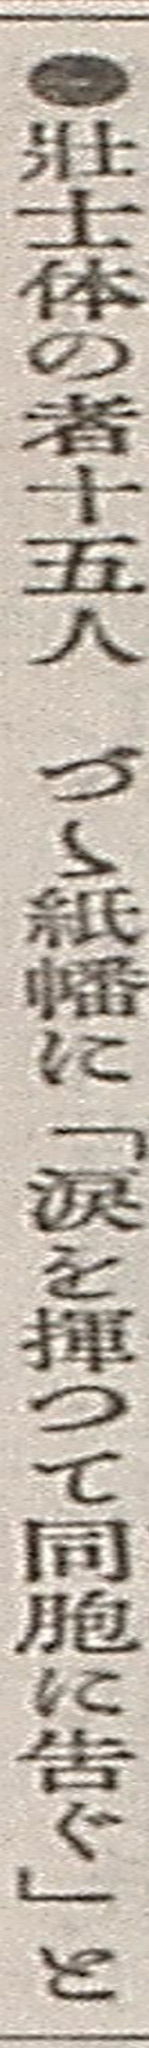●壮士体の者十五人づゝ紙幡に「涙を揮つて同胞に告ぐ」と
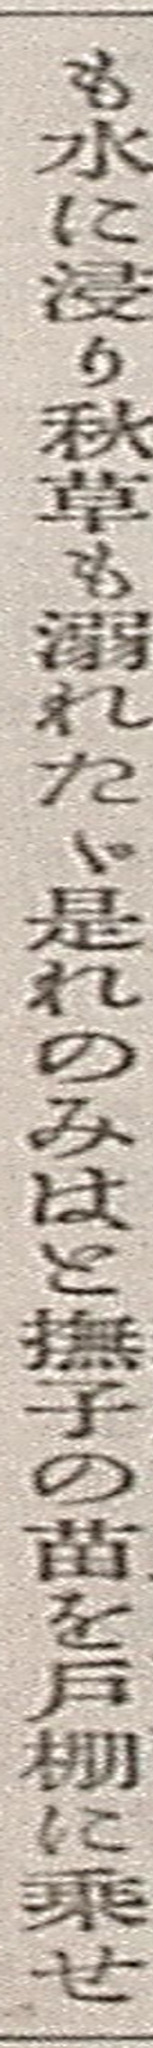も水に浸り秋草も溺れたゞ是れのみはと撫子の苗を戸棚に乗せ
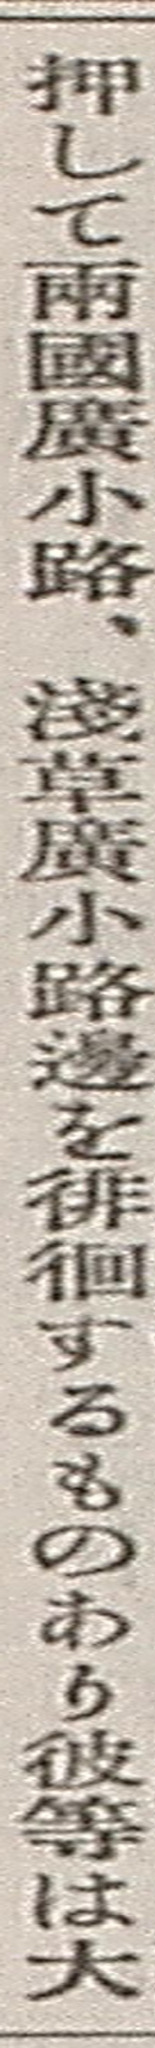押して両国広小路、浅草広小路辺を徘徊するものあり彼等は大
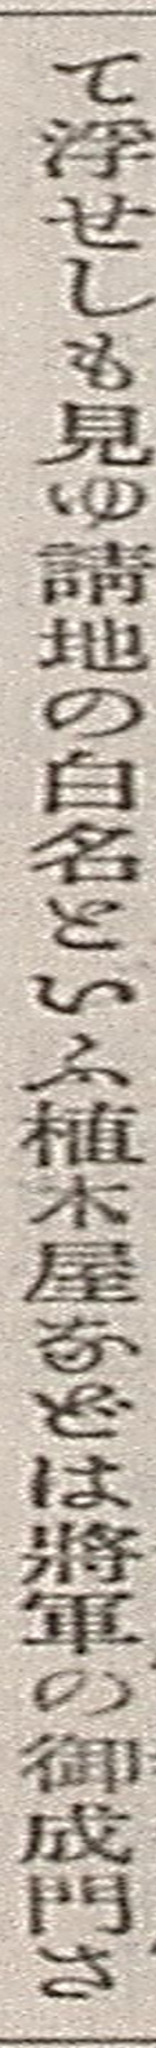て浮せしも見ゆ請地の白名といふ植木屋などは将軍の御成門さ
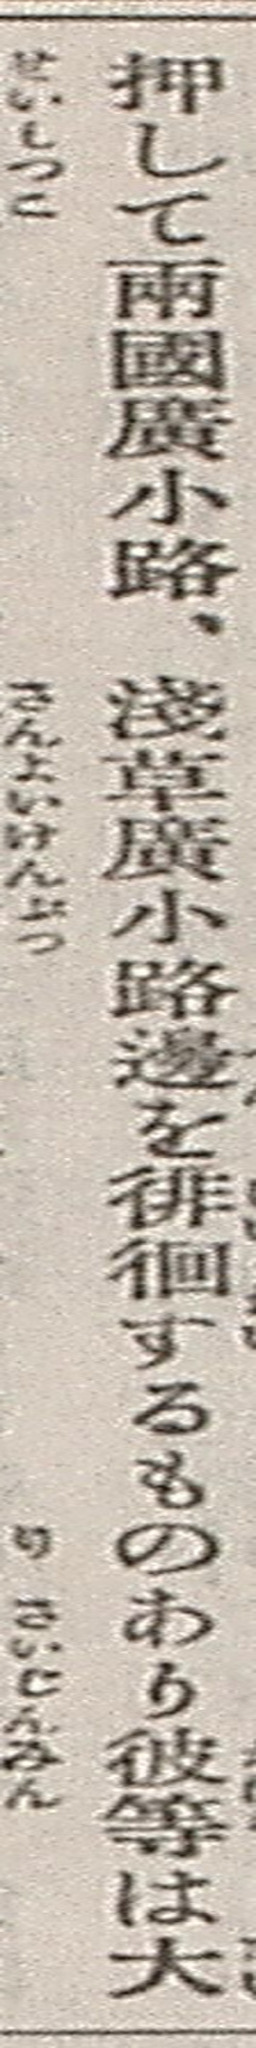押して両国広小路、浅草広小路辺を徘徊するものあり彼等は大
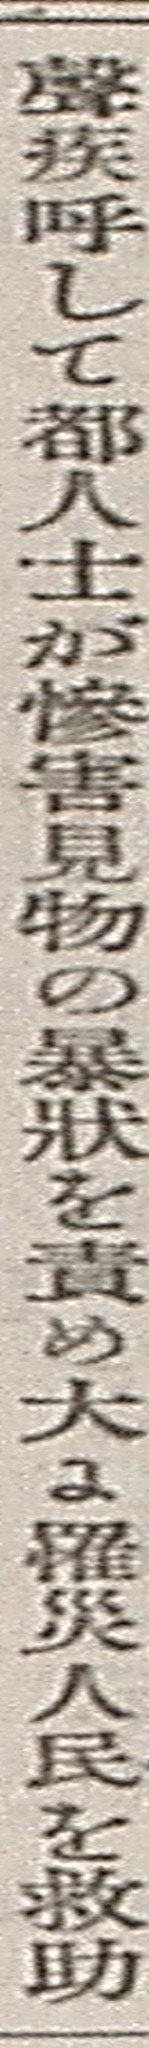声疾呼して都人士が惨害見物の暴状を責め大に罹災人民を救助
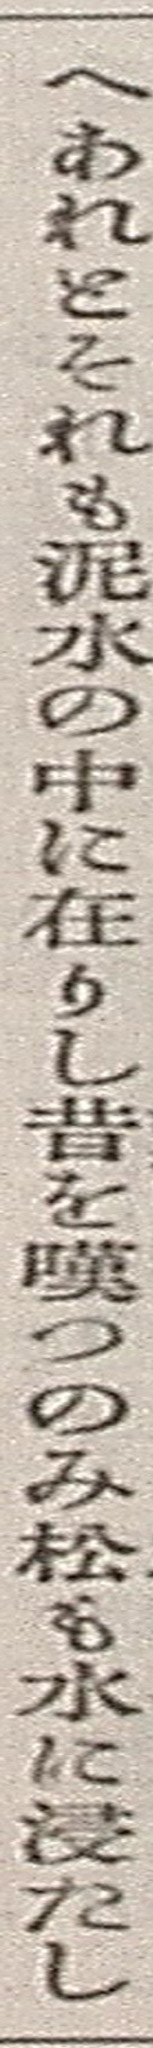へあれとそれも泥水の中に在りし昔を嘆つのみ松も水に浸たし
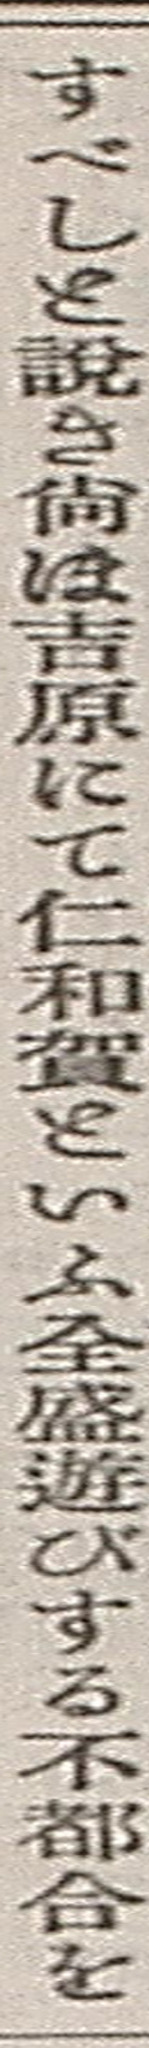すべしと説き尚ほ吉原にて仁和賀といふ全盛遊びする不都合を
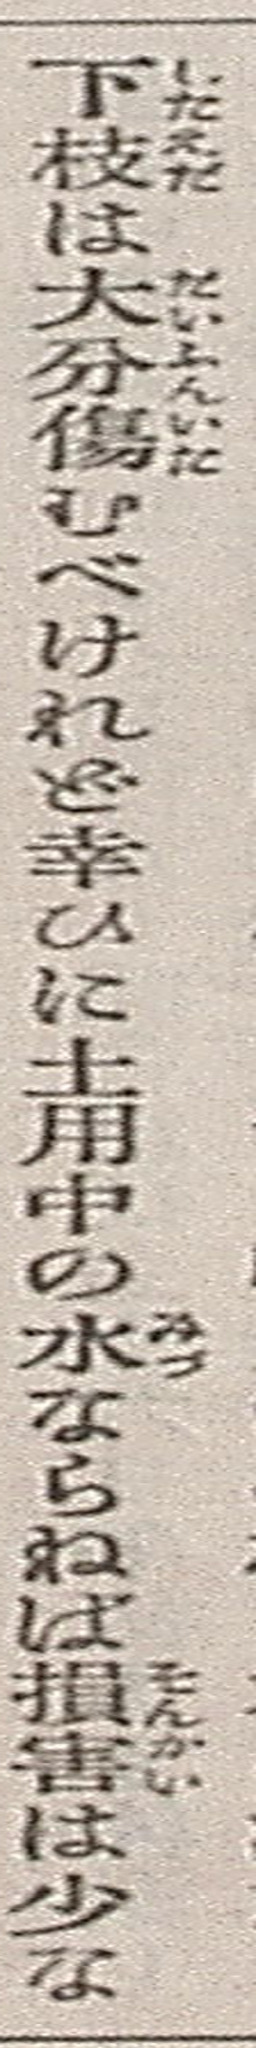下枝は大分傷むべけれど幸ひに土用中の水ならねば損害は少な
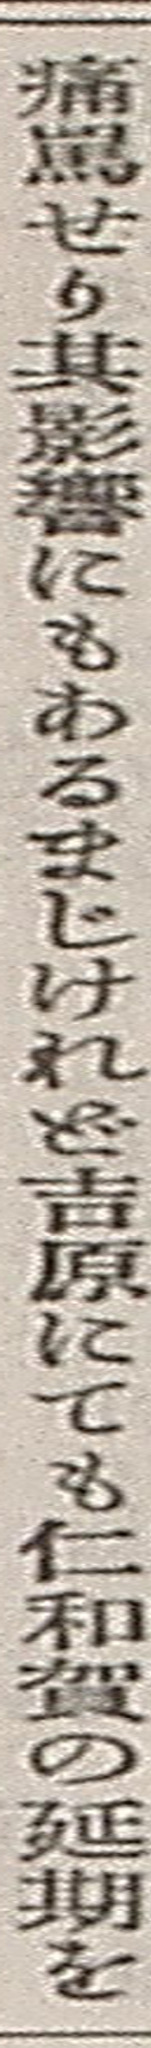痛罵せり其影響にもあるまじけれど吉原にても仁和賀の延期を
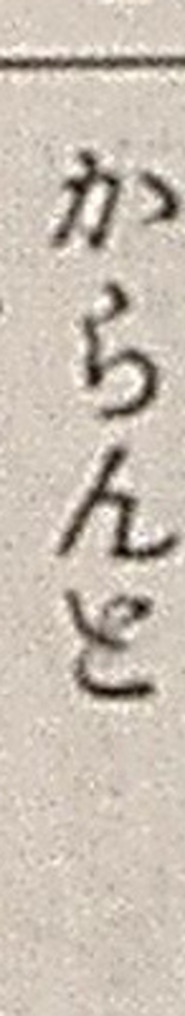からんと
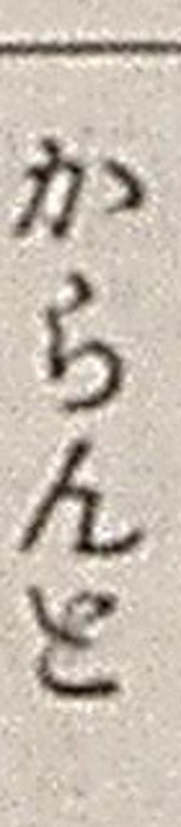からんと
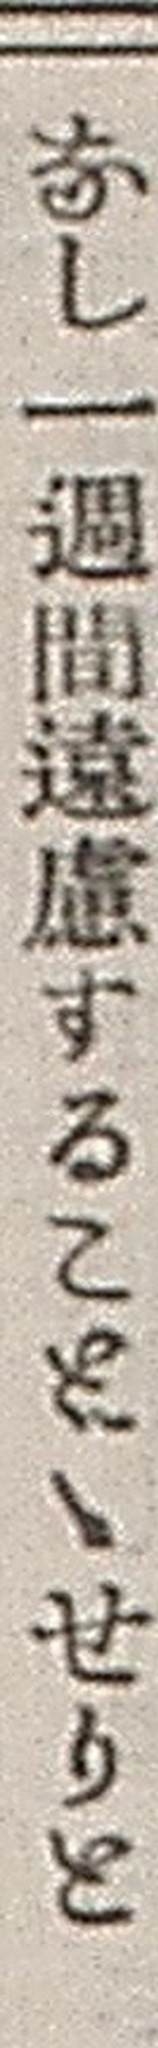なし一習慣遠慮することゝせりと
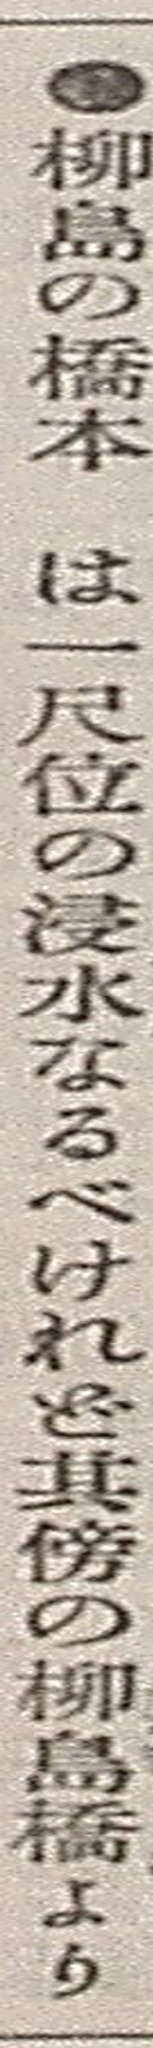●柳島の橋本は一尺位の浸水なるべけれど其傍の柳島橋より
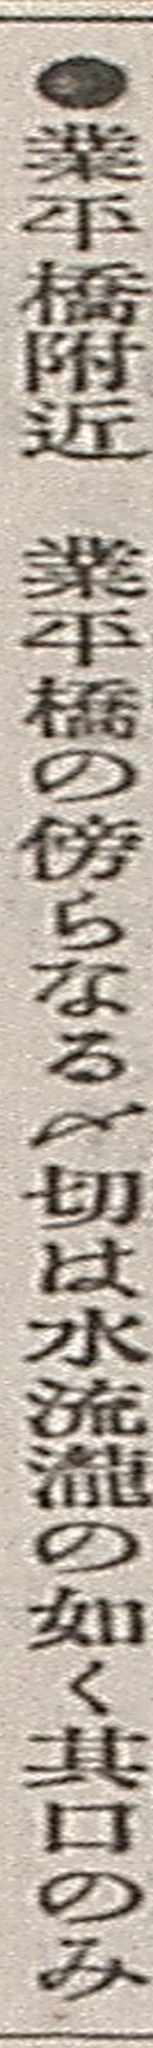●業平橋附近業平橋の傍らなる〆切は水流瀧の如く其口のみ
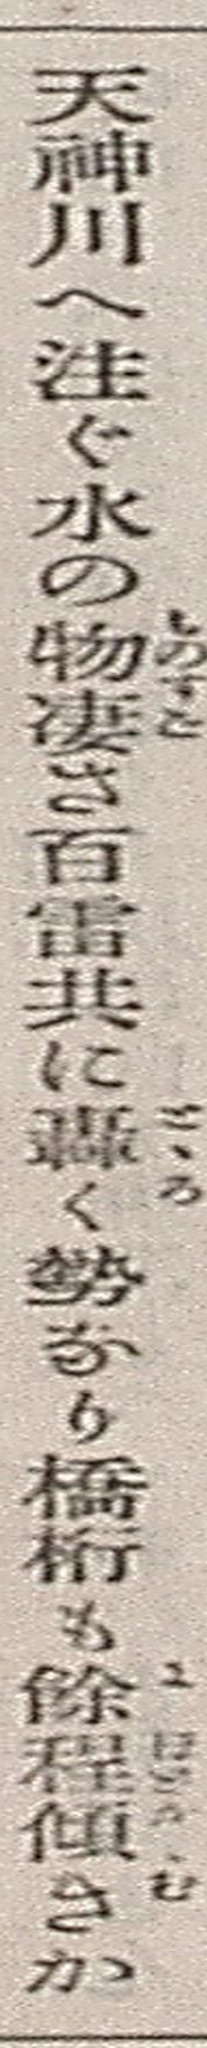天神川へ注ぐ水の物凄さ百雷共に轟く勢なり橋桁も余程傾きか
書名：風俗畫報臨時増刊第百二十四號　洪水地震被害録（上）
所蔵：東京大学地震研究所図書室 Earthquake Research Institute Library, The University of Tokyo, JAPAN
